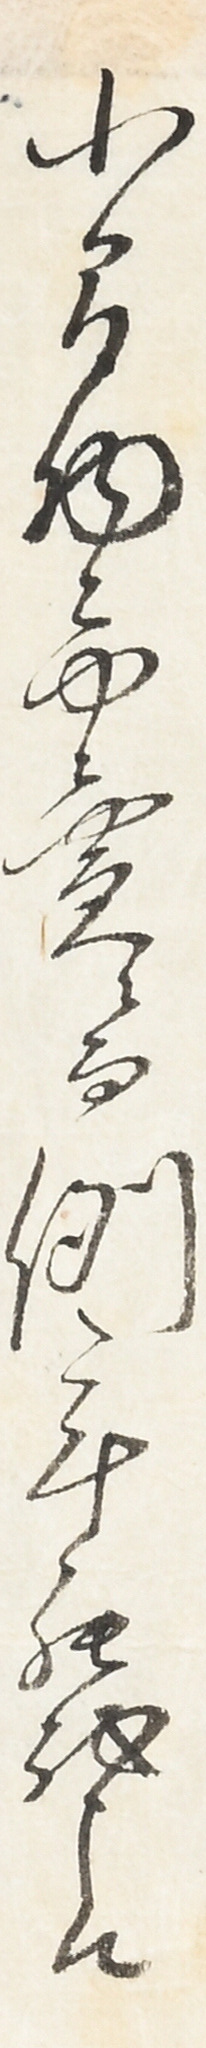小間物商売ニ而例年罷越申候
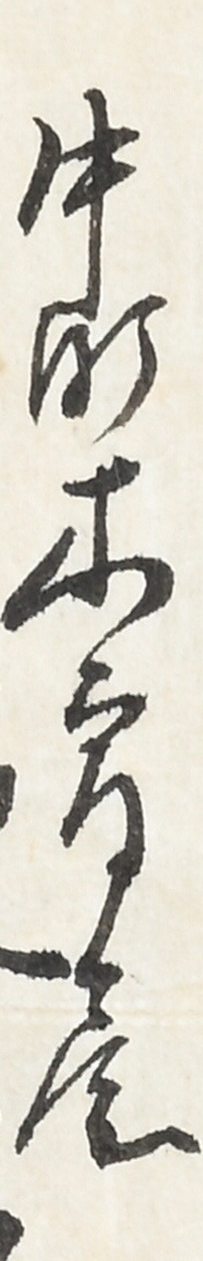中町木曽屋
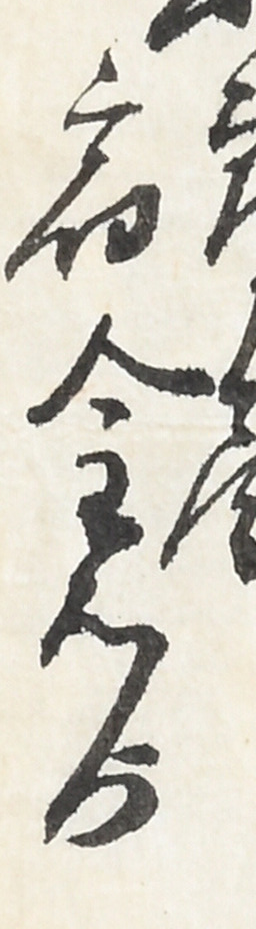宿金右衛門

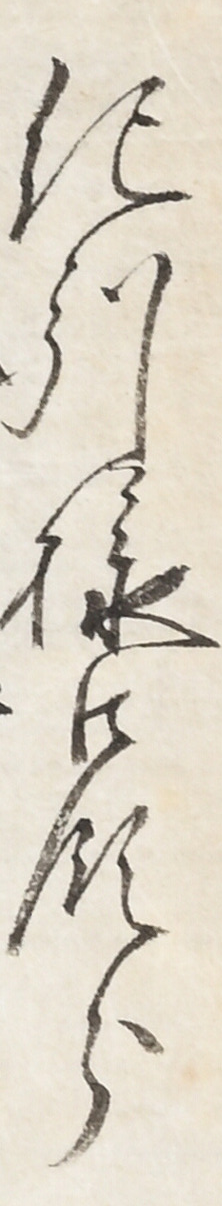紀州様御領分
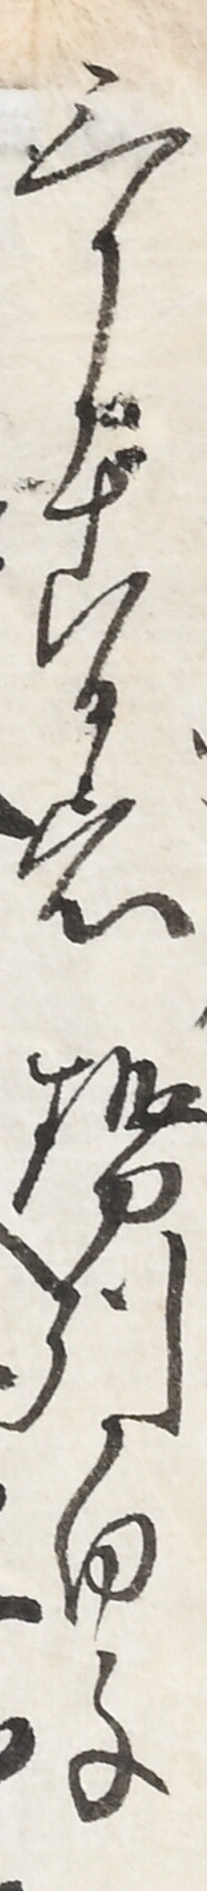三月十八日着勢州白子
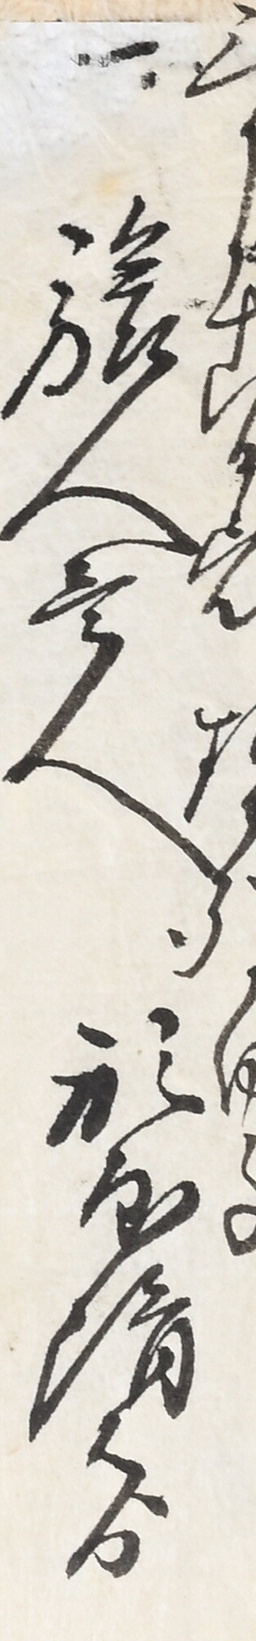一旅人壱人形屋清右衛門
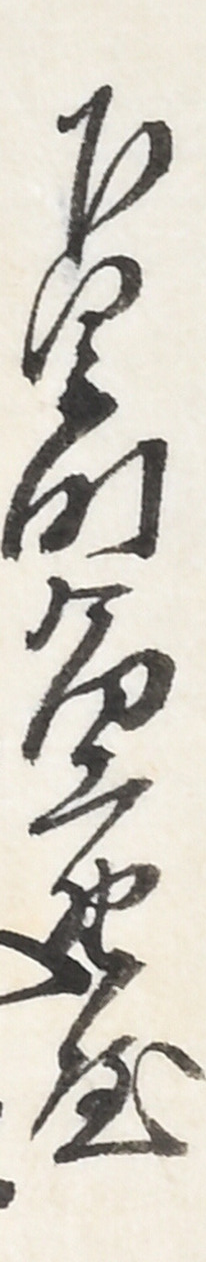下里町冨二野屋
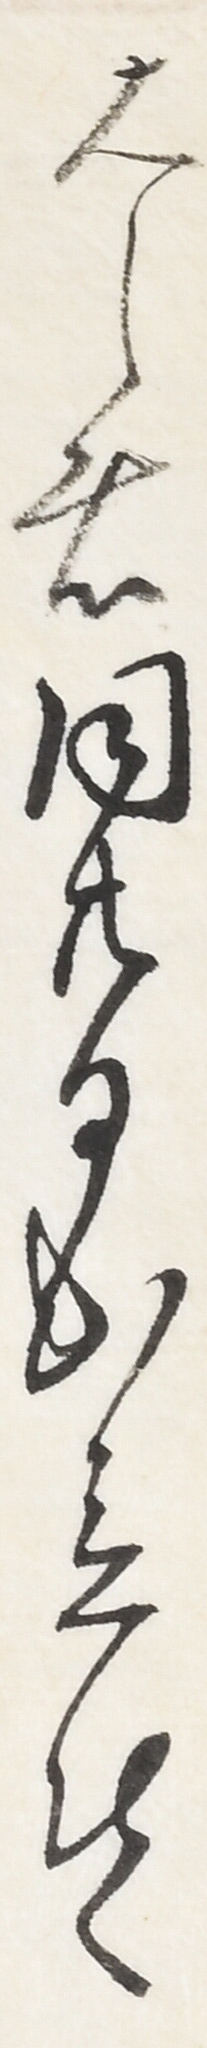右之者同廿日出立仕候
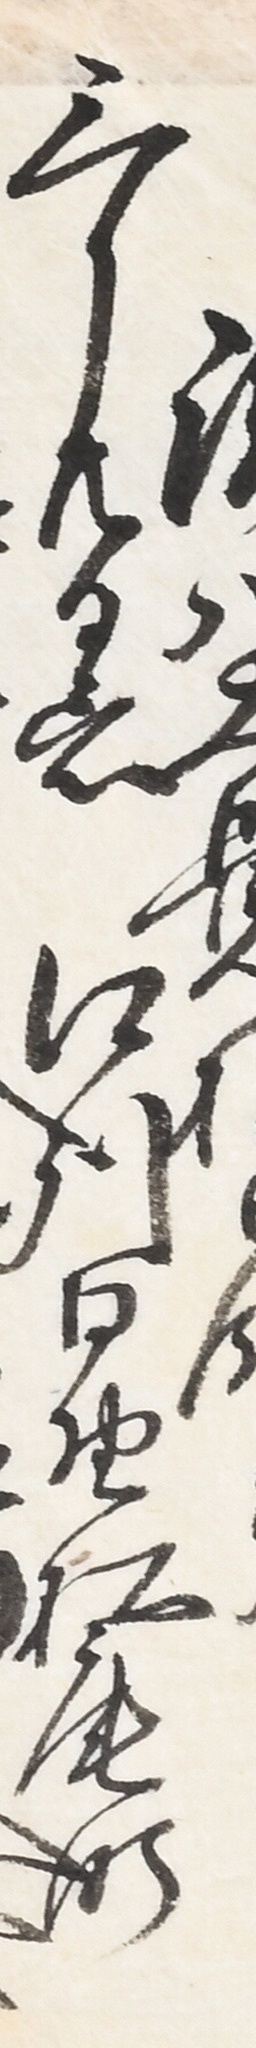三月廿日着江州日野松尾町
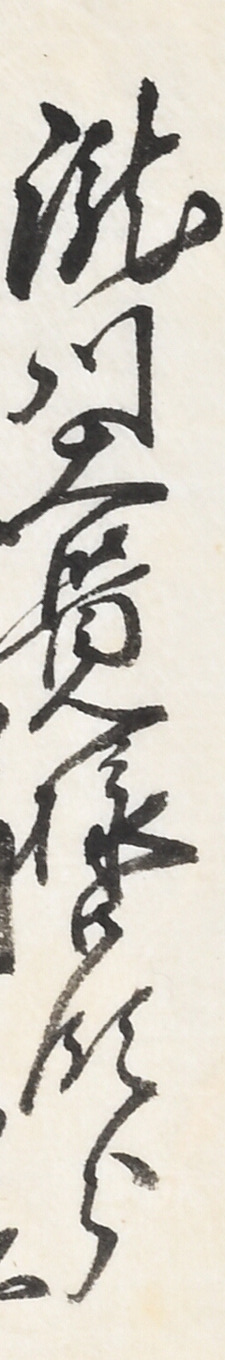瀧川大覚様御領分
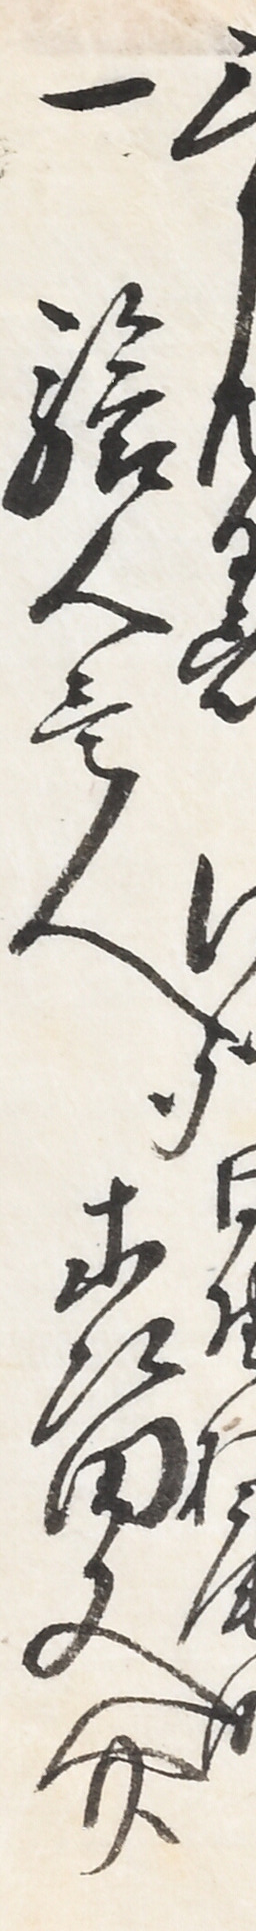一旅人壱人森田又介
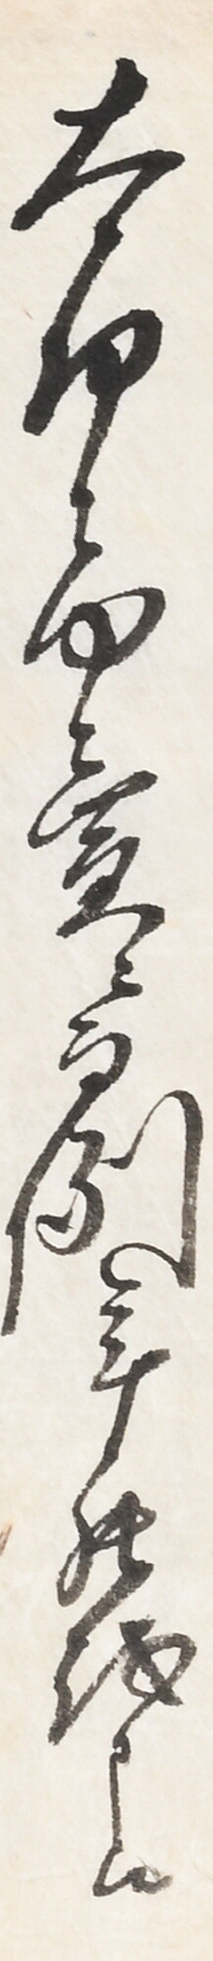押形商売ニ而例年罷越申候
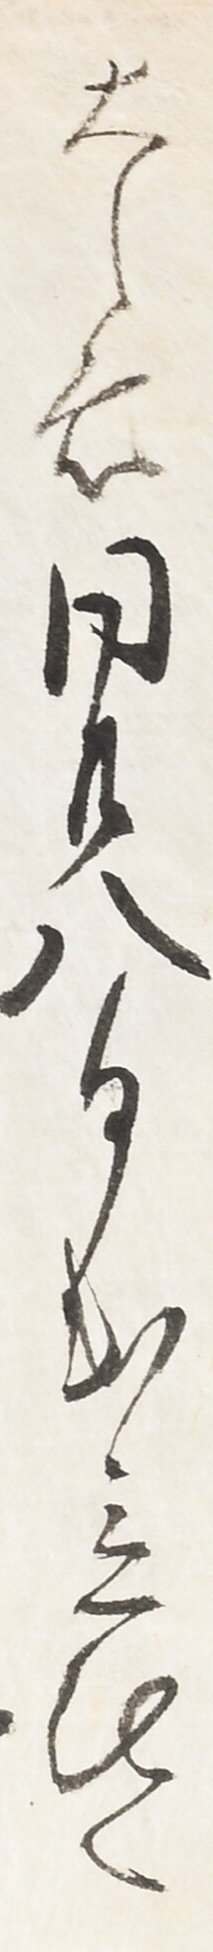右之者同廿日出立仕候
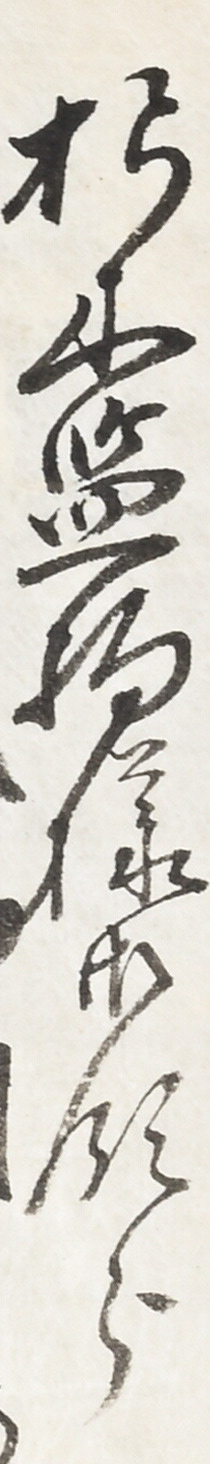松木監物様御領分
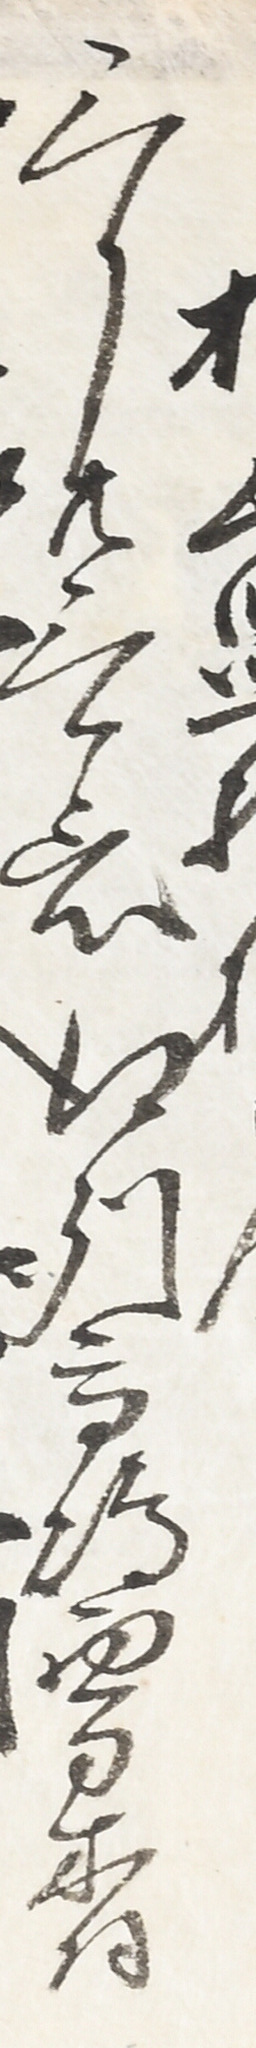三月廿三日着江州高嶋西万木村
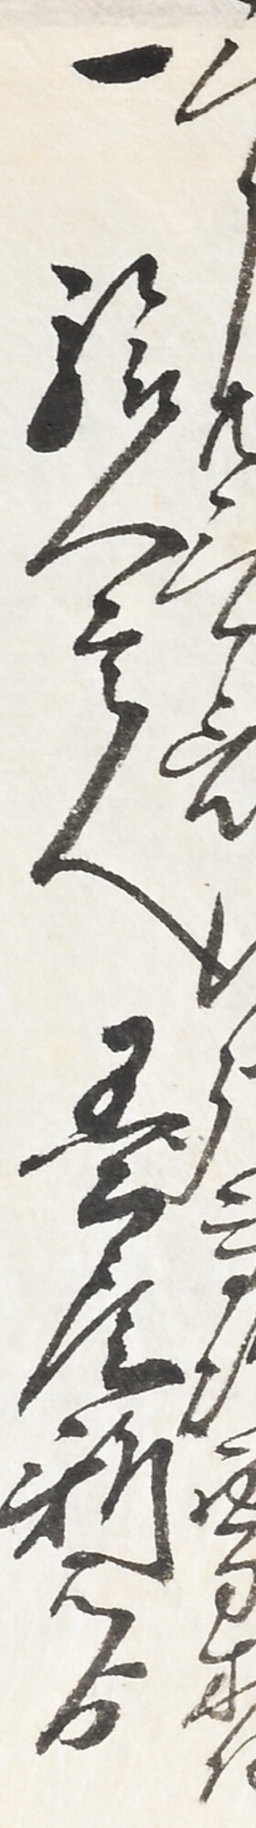一旅人壱人墨屋新右衛門
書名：旅人泊控帳
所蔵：伊那市立高遠町図書館・合同会社AMANE
